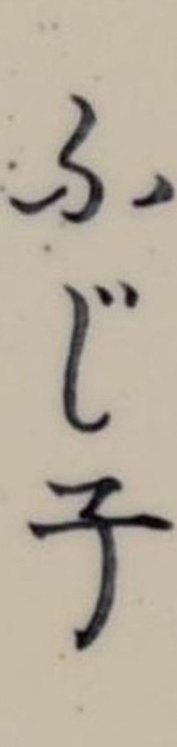ふじ子
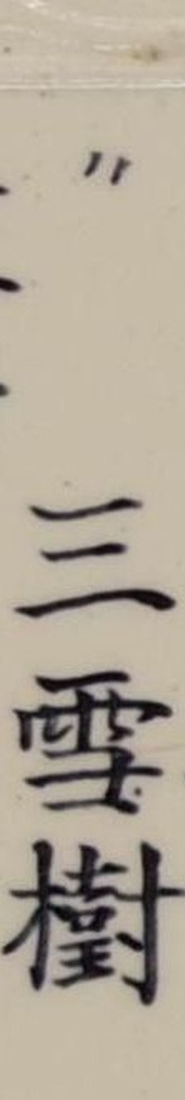三雪樹
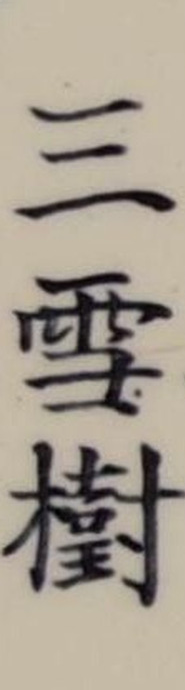三雪樹
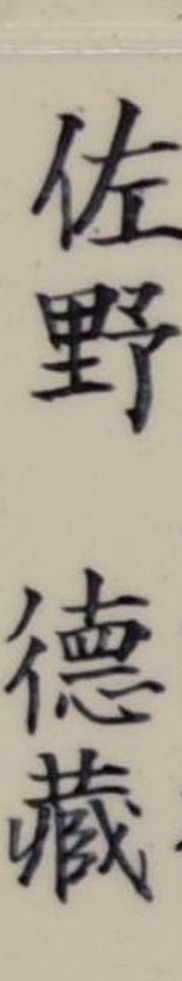佐野徳蔵

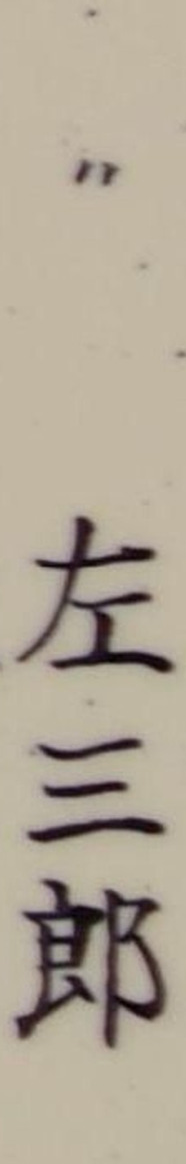左三郎
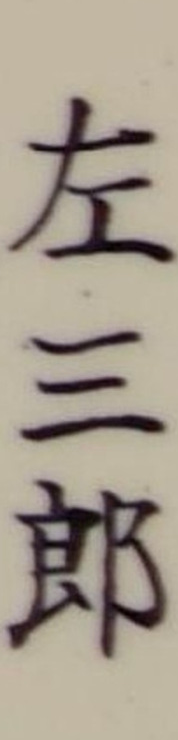左三郎
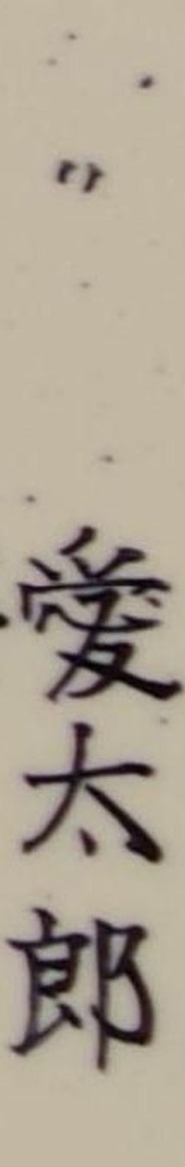愛太郎
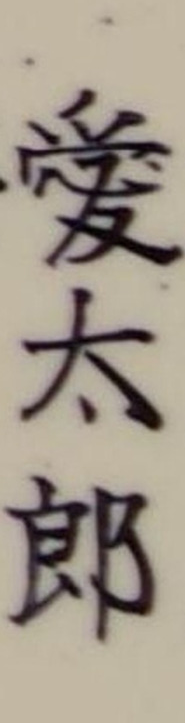愛太郎
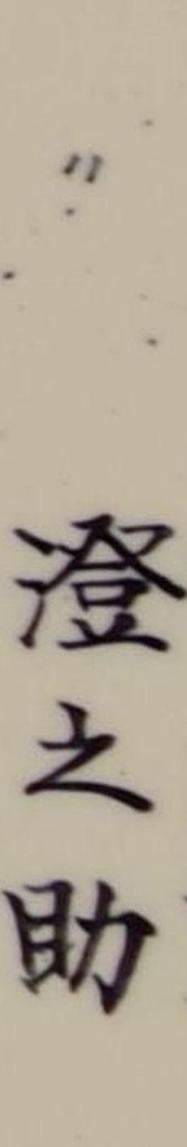澄之助
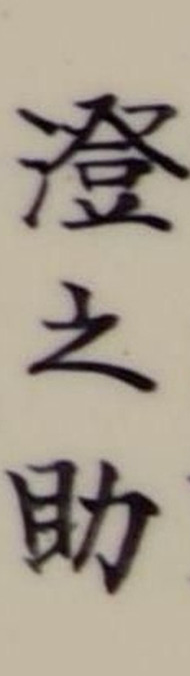澄之助
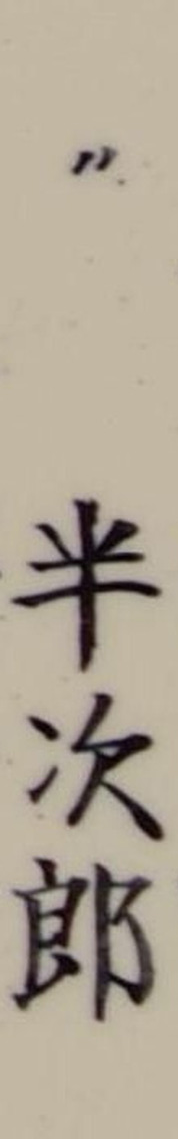半次郎
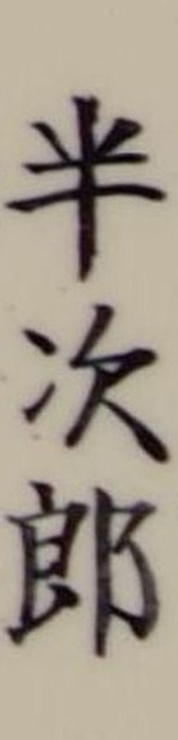半次郎
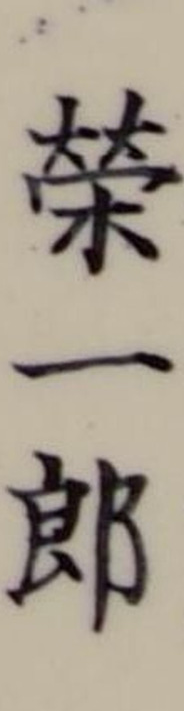榮一郎
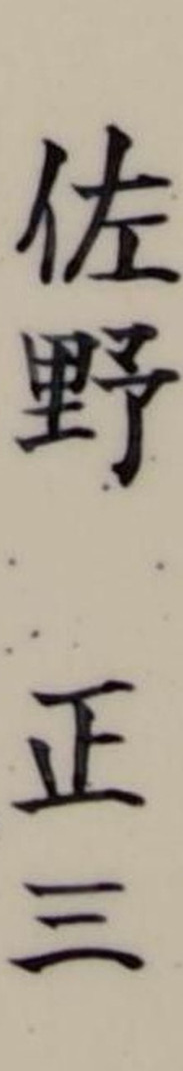佐野正三
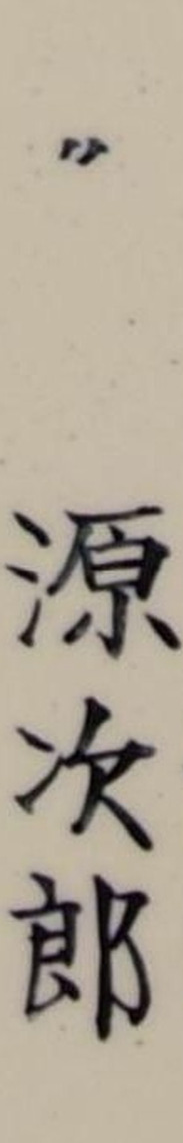源次郎
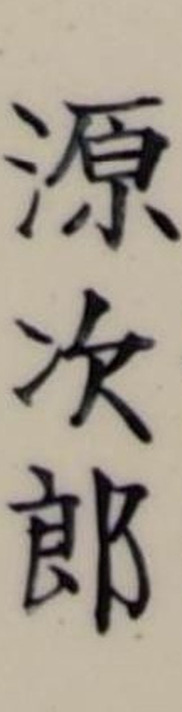源次郎
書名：E~L
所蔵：高野山金剛峯寺
